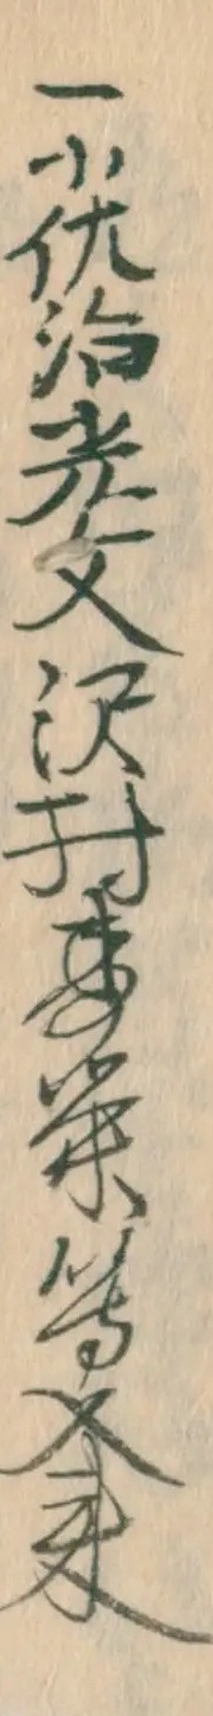一小佐治光文沢村寿栄等入来
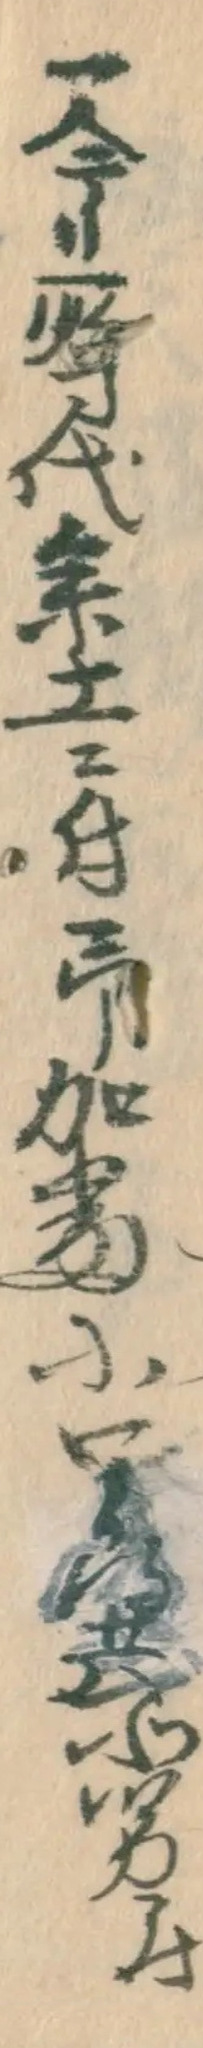一今日所司代参上ニ付予加番小口候得共所労ニ付
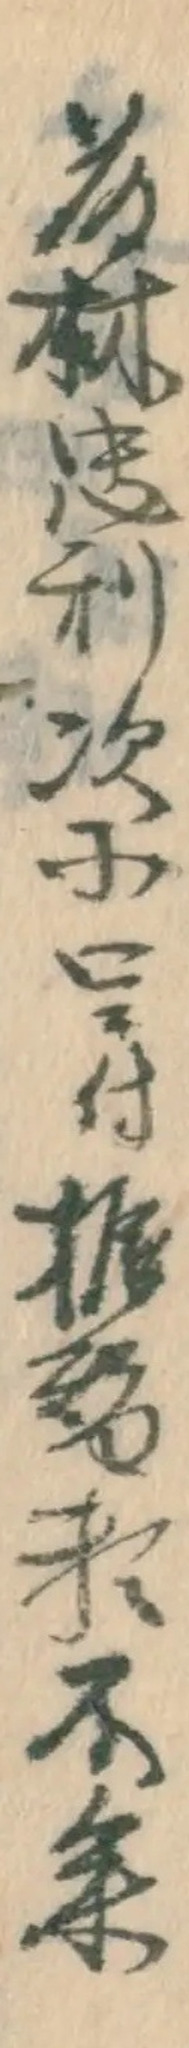藤林忠利次小口ニ付振替頼不参
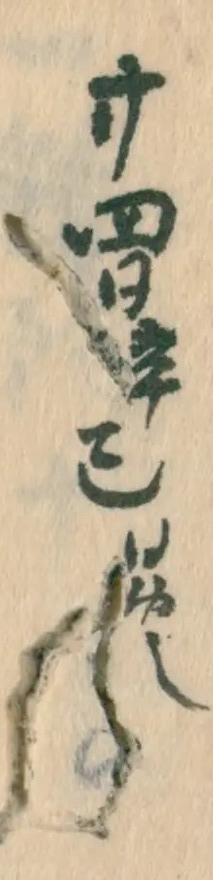廿四日辛巳曇

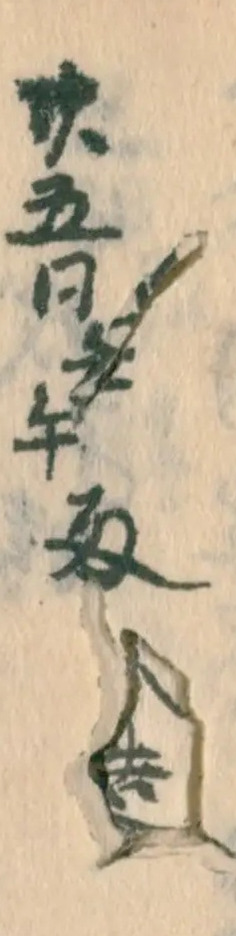廿五日壬午雨
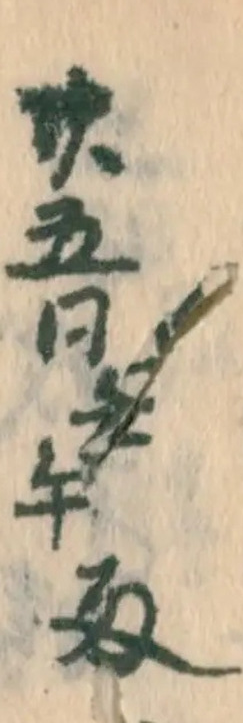廿五日壬午雨
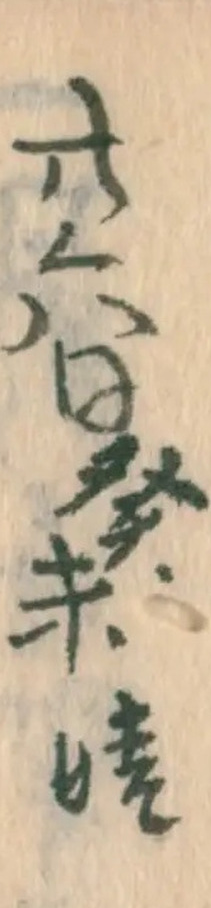廿六日癸未晴
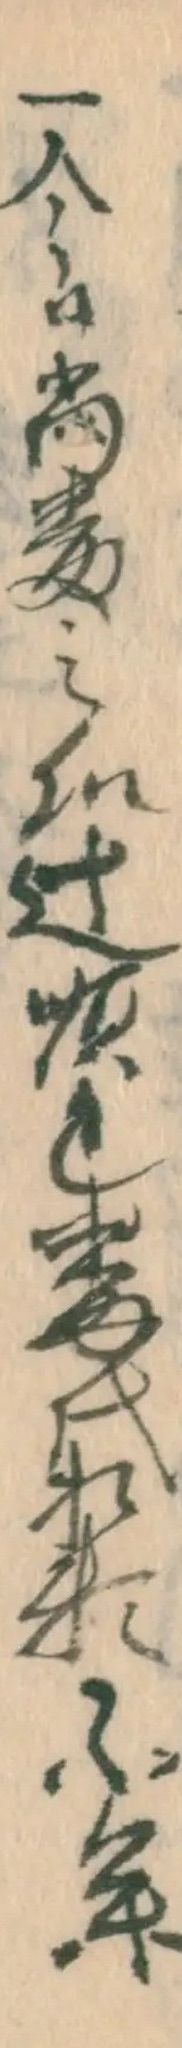一今日当番之処辻順近番代相頼不参
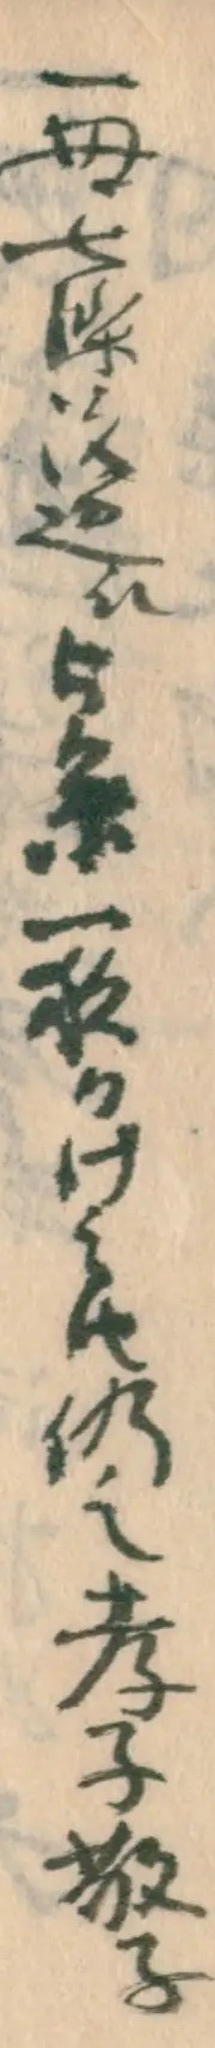一母七条辺え被参一夜かけ之由依之孝子敬子
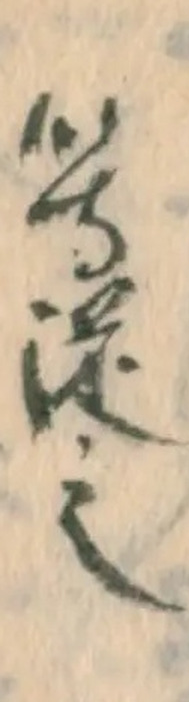等従之
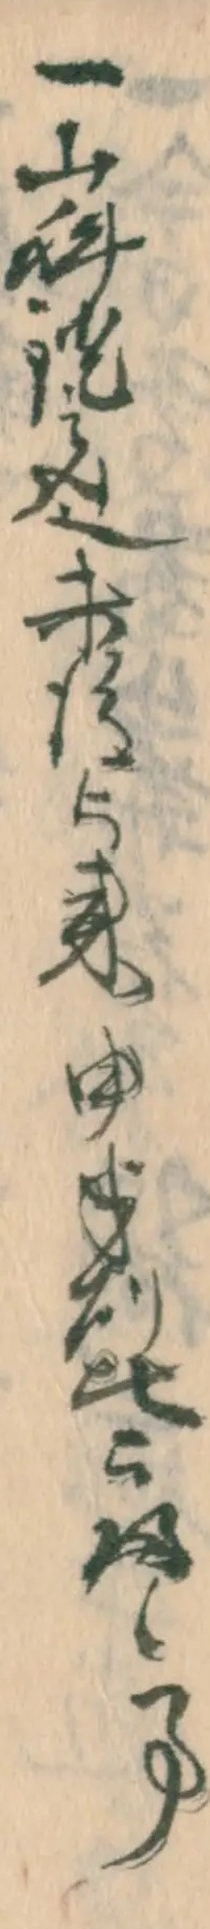一山科院之処未後被参申半刻頃被帰候事
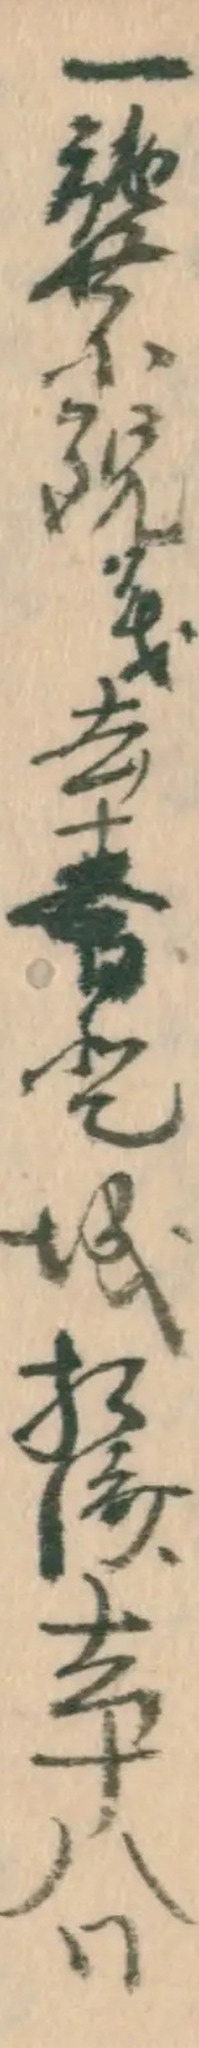一施薬院義去十五日登城相済去十八日
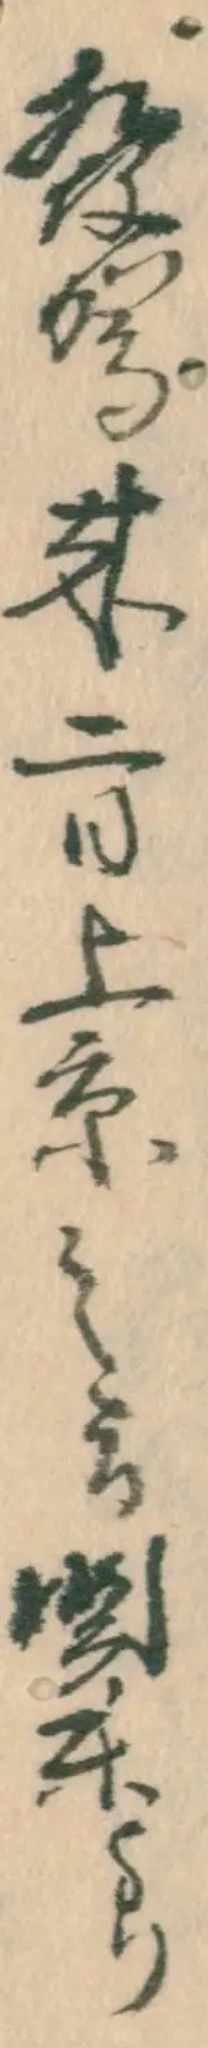発駕来二日上京之旨関東より
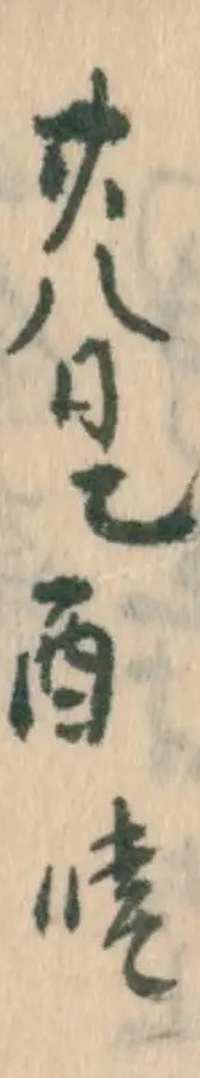廿八日乙酉晴
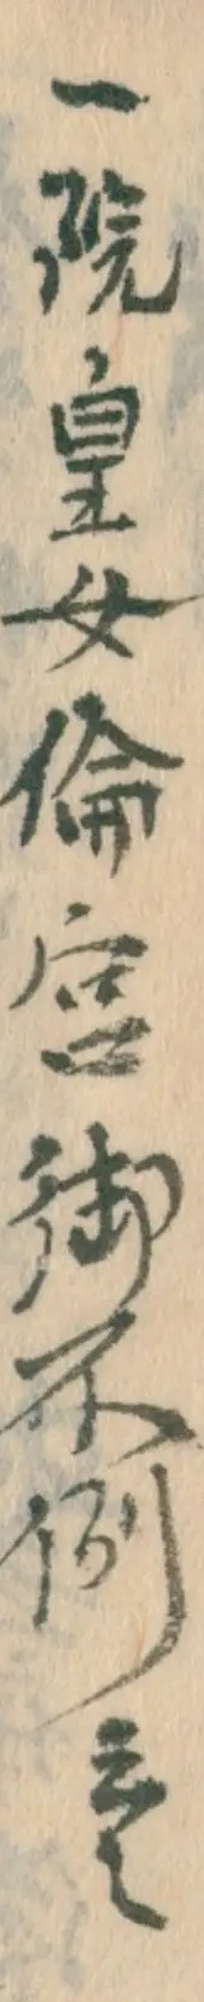一院皇女倫宮御不例云々
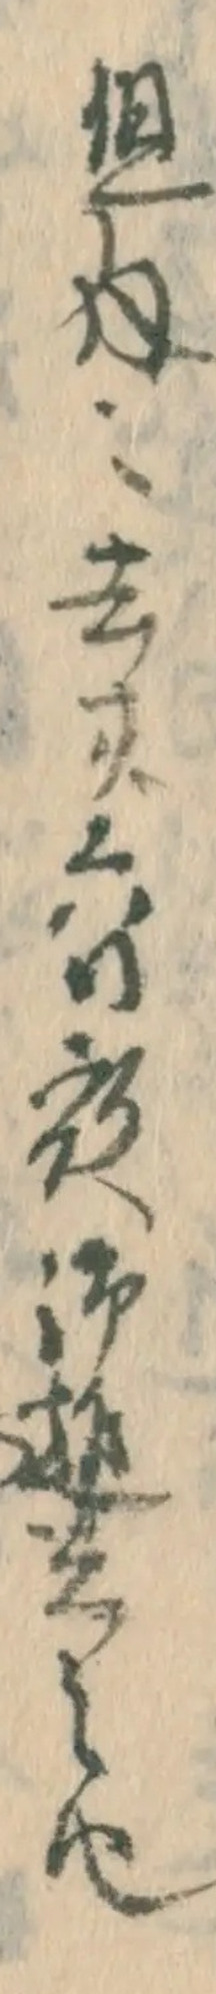但内々去廿六日夜御逝去之由
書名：禁裏御所御用日記. [131]
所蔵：国立国会図書館 National Diet Library, JAPAN
